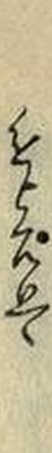進被召上候
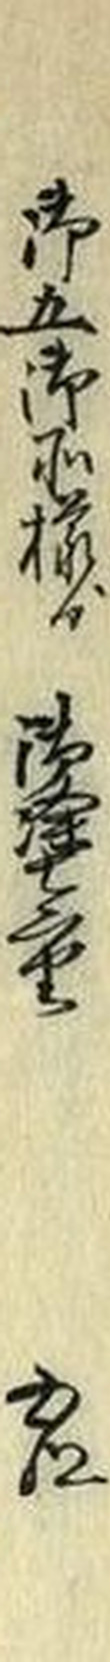御五御所様ゟ御塗重五組
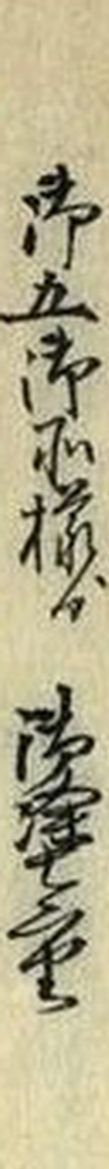御五御所様ゟ御塗重五組
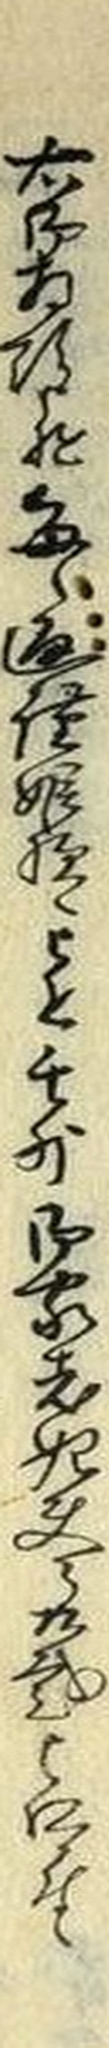右御拝領被遊毎之通謹姫様へ被進其外御家老始夫々頂戴被仰付候
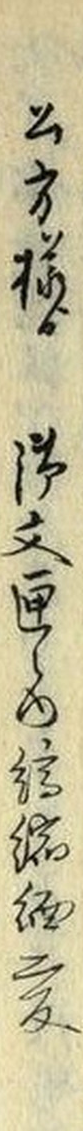公方様ゟ御文匣之内縞縮緬二反
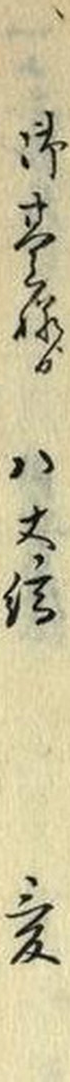御台様ゟ八丈縞三反
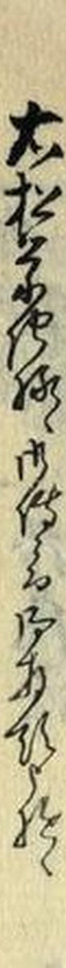右松栄院様へ御伝ニ而御拝領被遊候
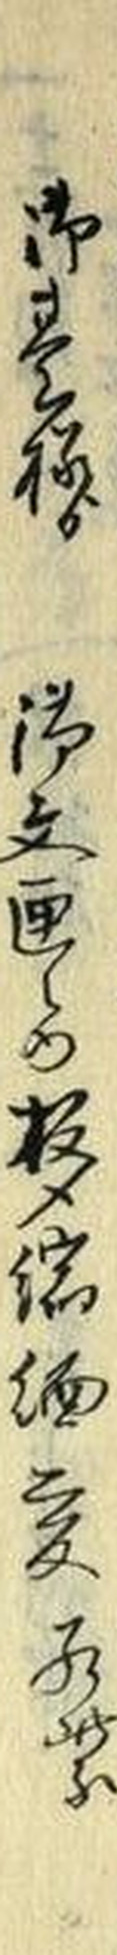御台様ゟ御文匣之内板〆縮緬二反紅葉
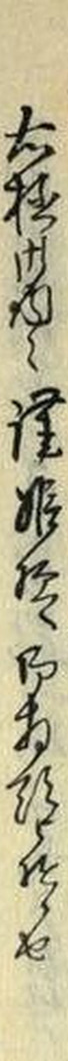右極御内々謹姫様へ御拝領被遊候由
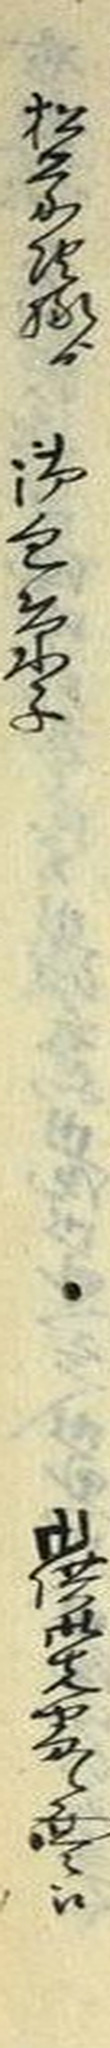松栄院様ゟ御包菓子御供御先番之面々江
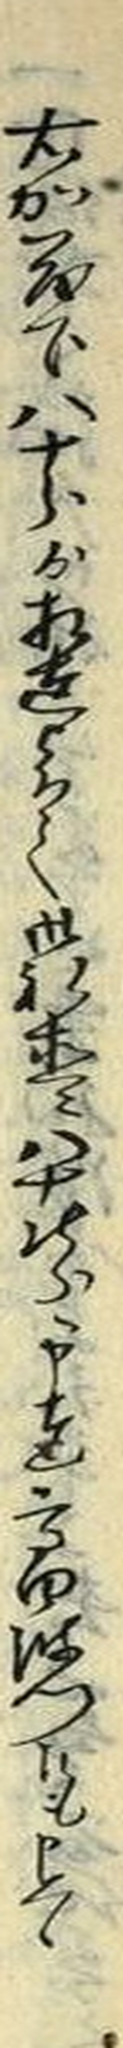右加茂下八十郎ゟ相達被下之御礼直ニ八十郎へ申達高田波門江も申上候
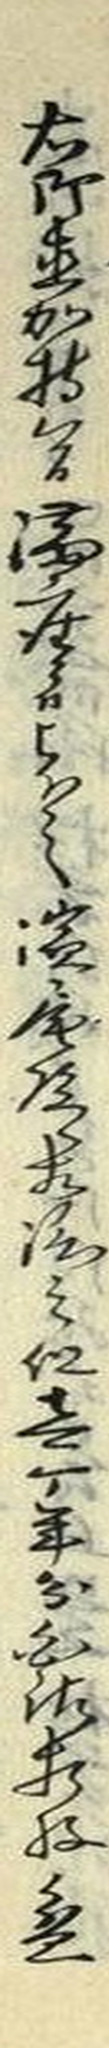右御直加持今日満座ニ付被下之浜尾殿へ相渡之但壱ケ年分白銀拾枚盆
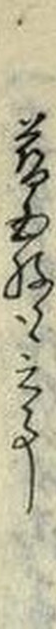暮五枚ツヽ之事
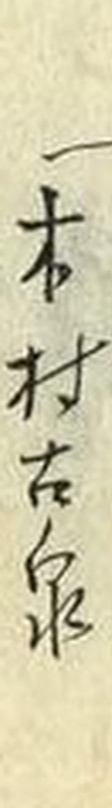木村古泉
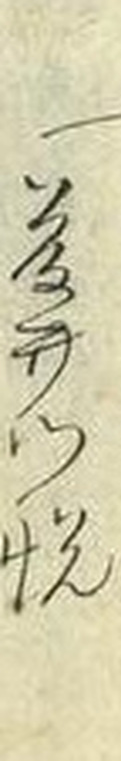藤井門悦
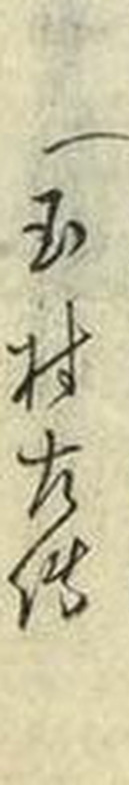玉村左伝
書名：少傅日録抄（斉善付側向頭取日記、在府）
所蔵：福井県文書館 Fukui Prefectural Archives
